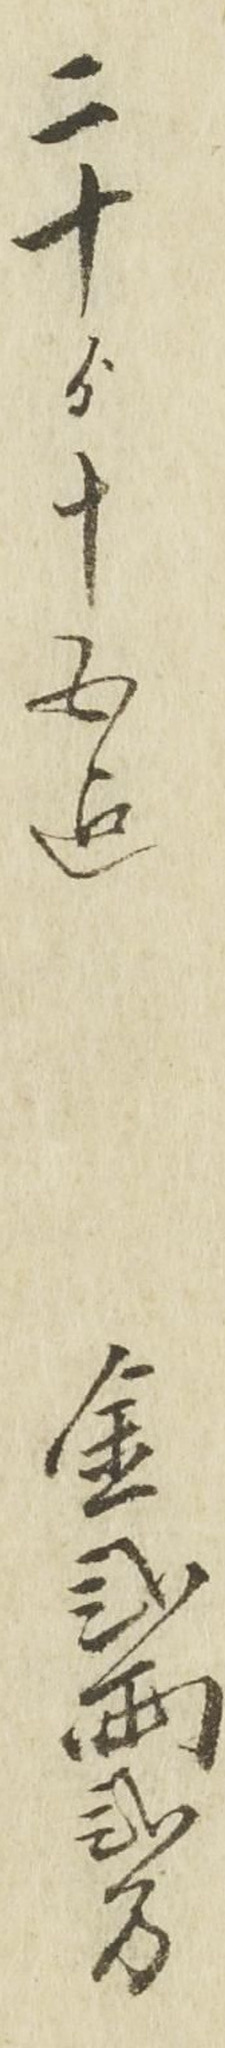二十ゟ十五迄金弐両弐分
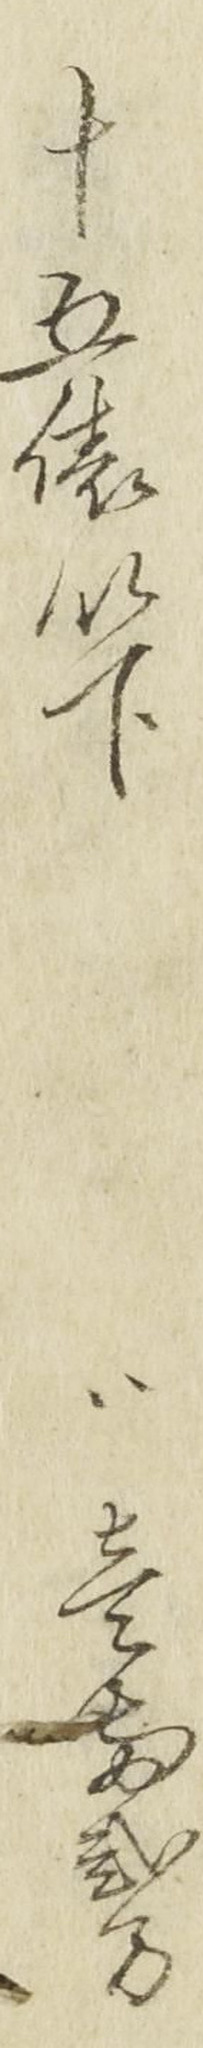十五俵以下同壱両弐分
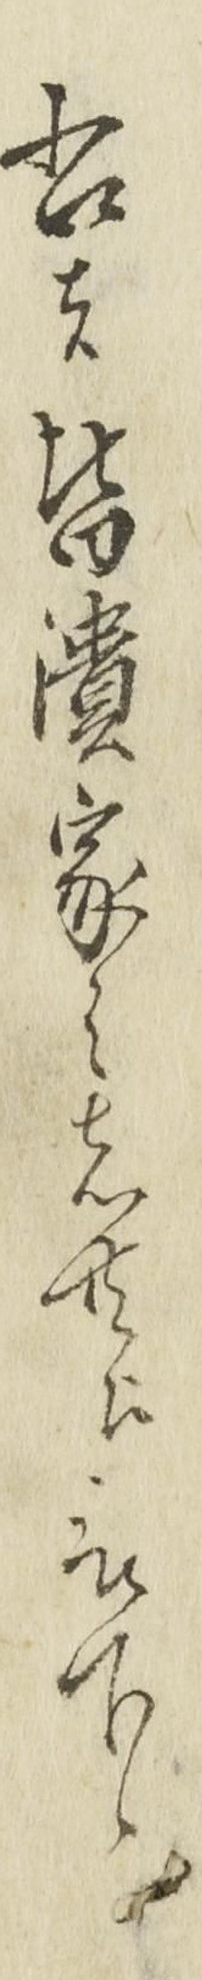右は皆潰家之者共え被下候
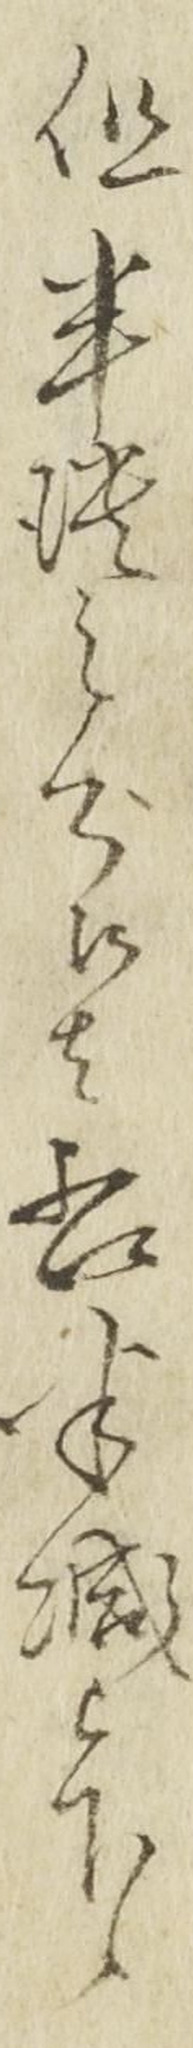但半潰之分えは右半減被下候
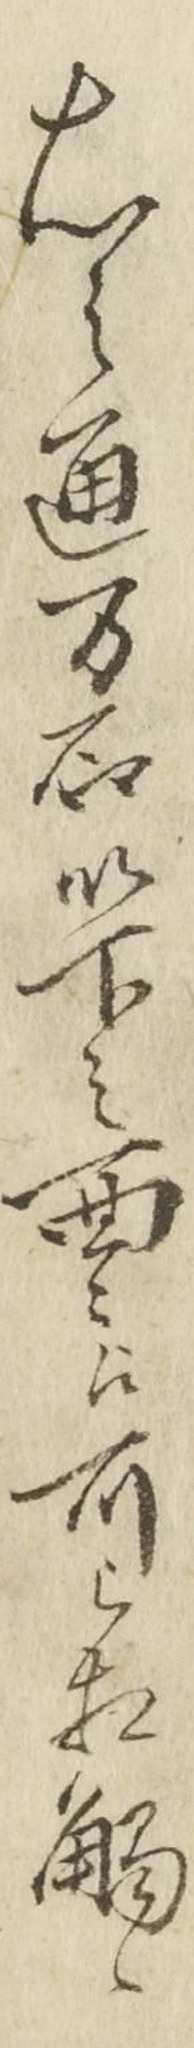右之通万石以下之面々江可被相触候
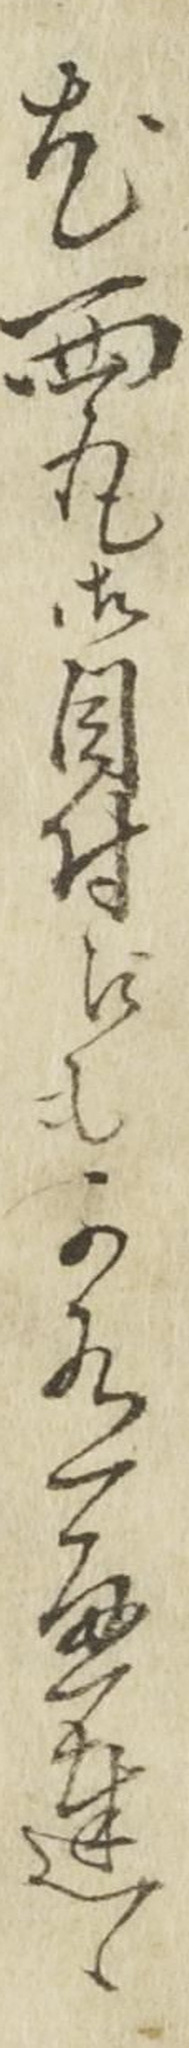尤西丸御目付えも可有通達候
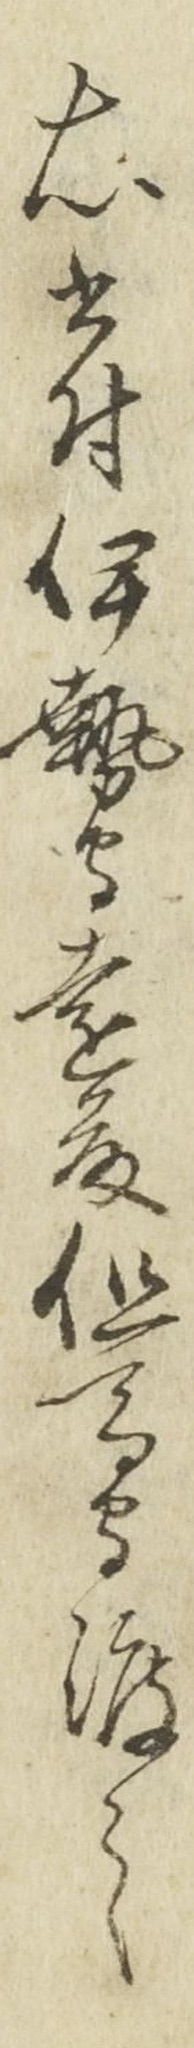右書付伊勢守遠藤但馬守渡之
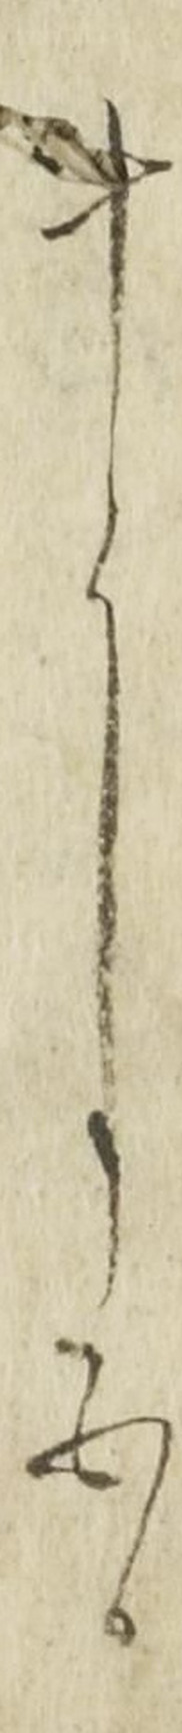十月五日
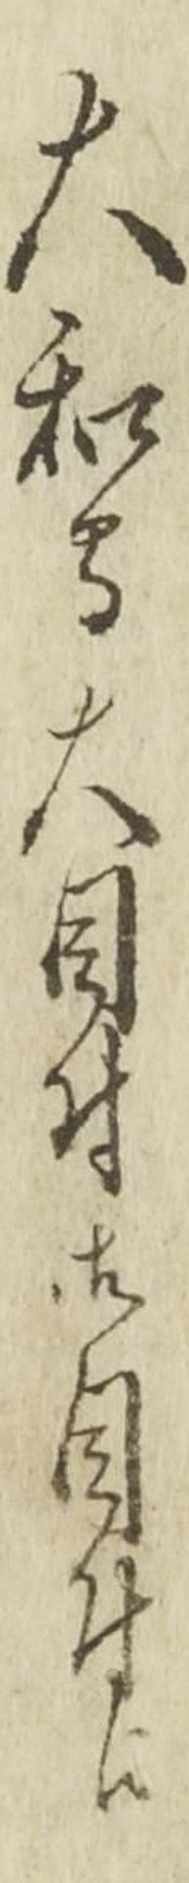大和守大目付御目付え
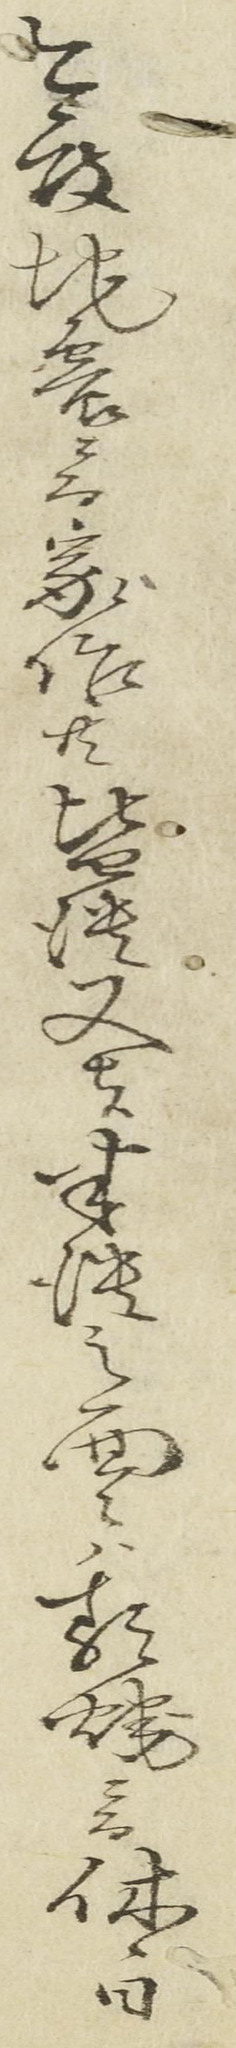今度地震に而家作共皆潰又は半潰之之面々ハ類焼ニ而休候日
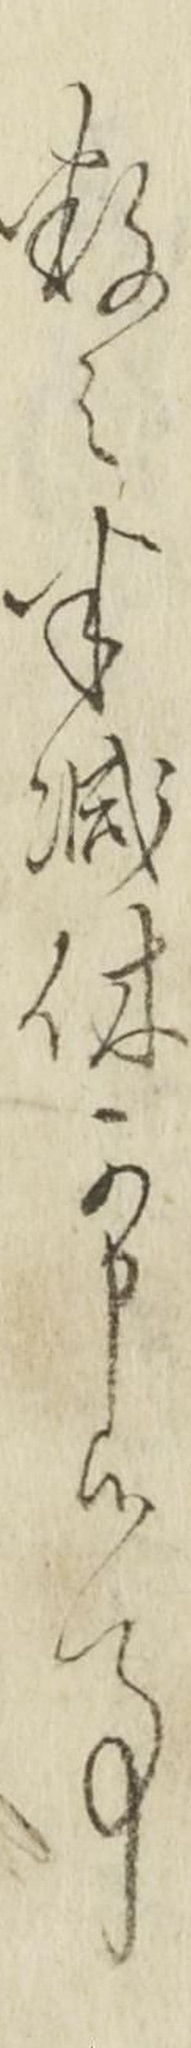数之半減休可申候事
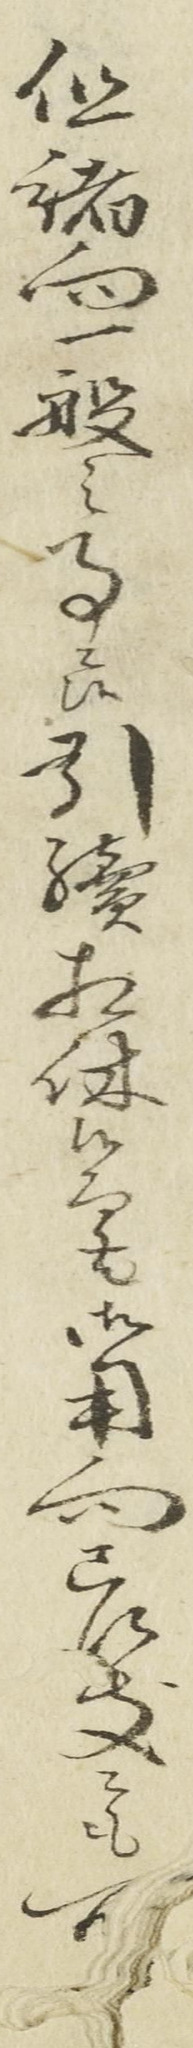但諸向一般之事ニ候引続相休候而ハ御用向差支ニも可
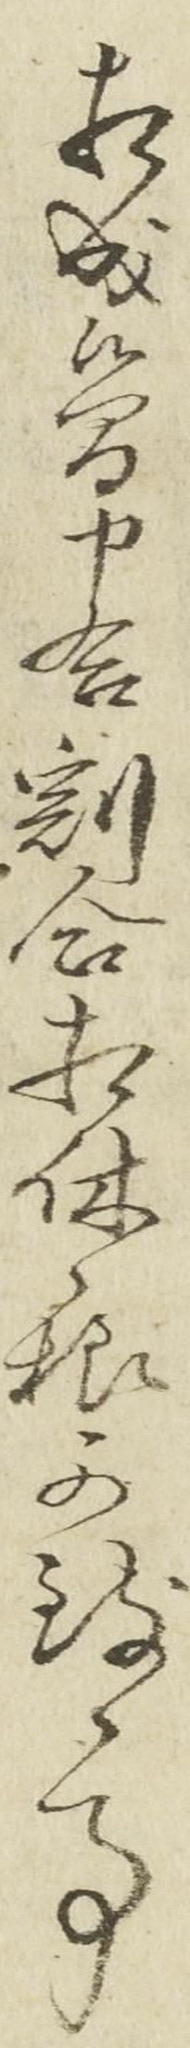相成候間申合割合相休候様可致候事
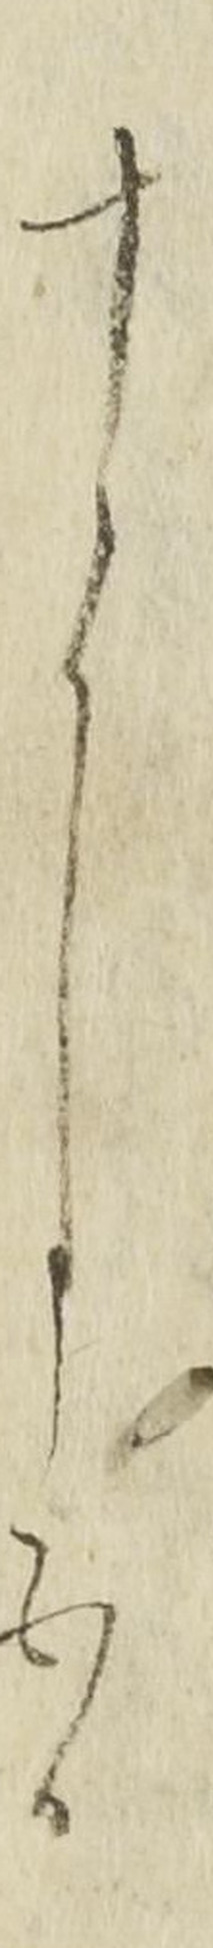十月五日
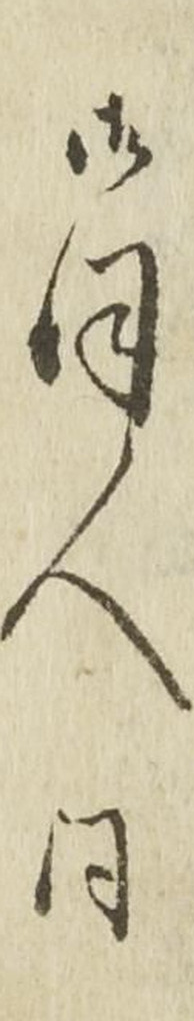御同人同
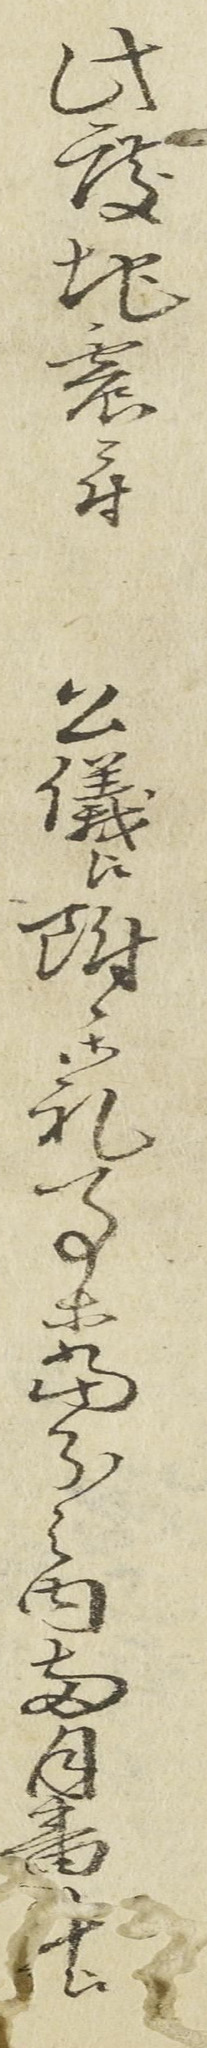今度地震二付公儀え附候御礼事等当分の内両月番斗え
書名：安政二乙卯年十月二日大地震之事
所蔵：東京大学地震研究所図書室 Earthquake Research Institute Library, The University of Tokyo, JAPAN
